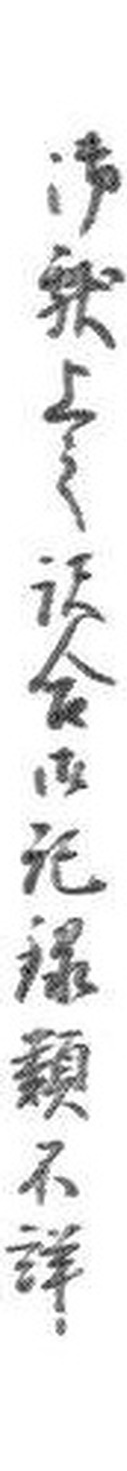御献上之訳合御記録類不詳
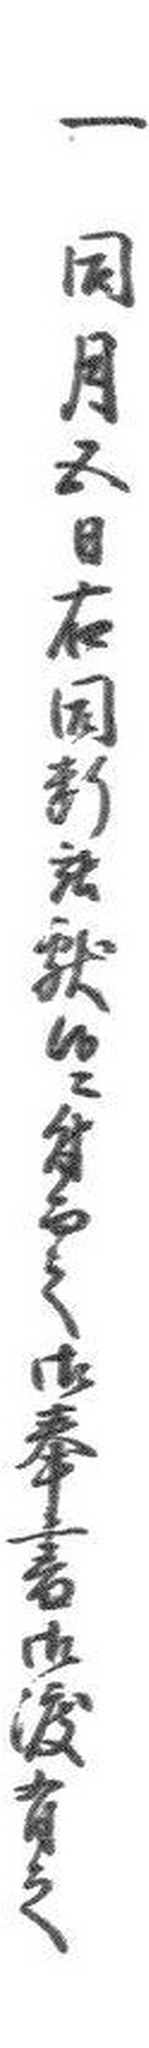一同月五日右同断献候ニ付而之御奉書御渡有之
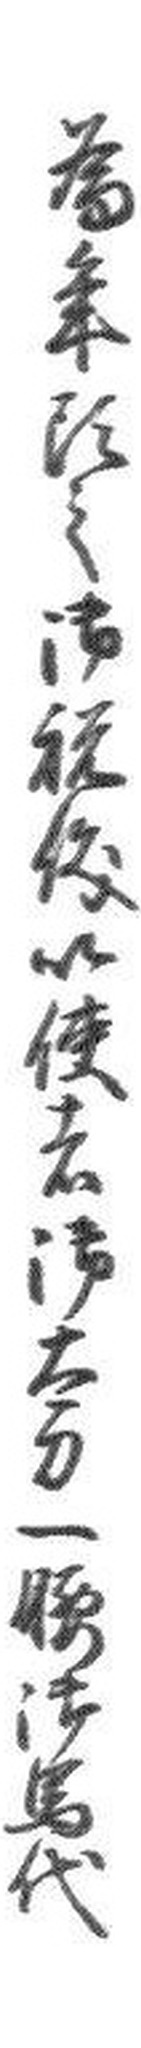為年頭之御祝儀以使者御太刀一腰御馬代
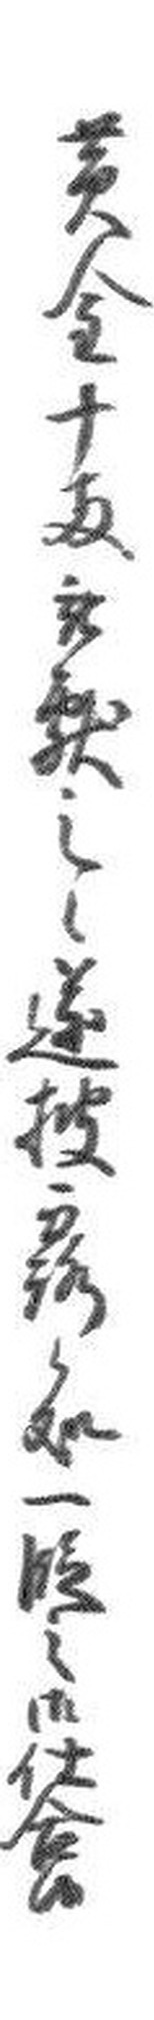黄金十両被献之候遂披露候処一段之御仕合候

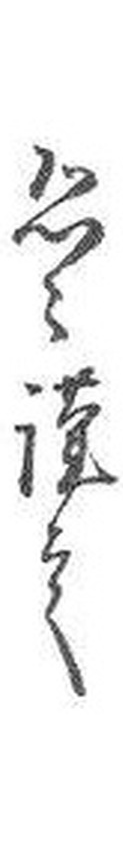恐々謹言
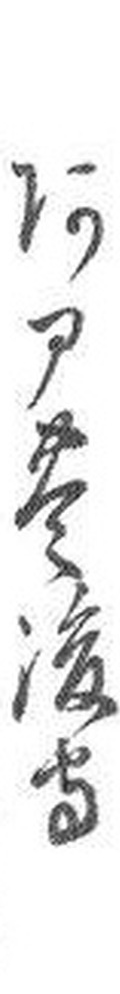阿部豊後守
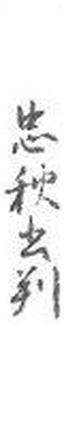忠清書判
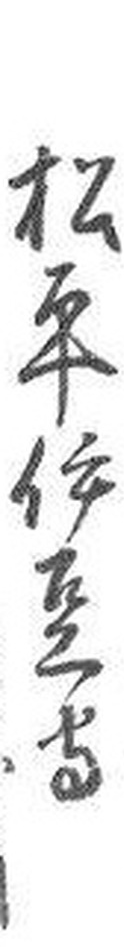松平伊豆守
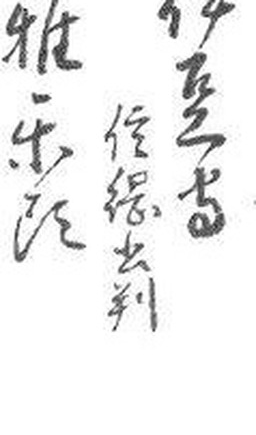信綱書判
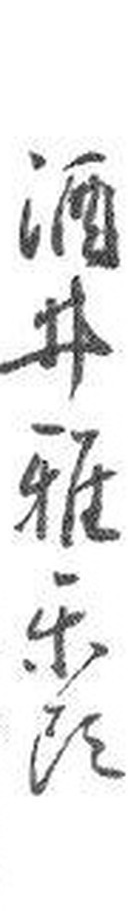酒井雅楽頭
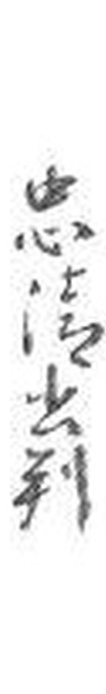忠清書判
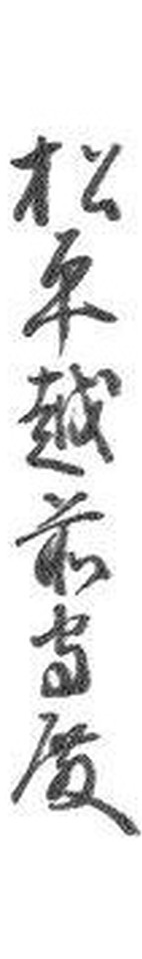松平越前守殿
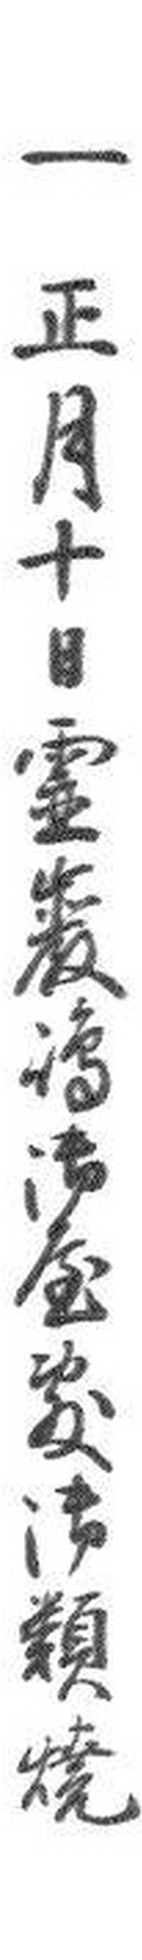一正月十日霊巌島御屋敷御類焼
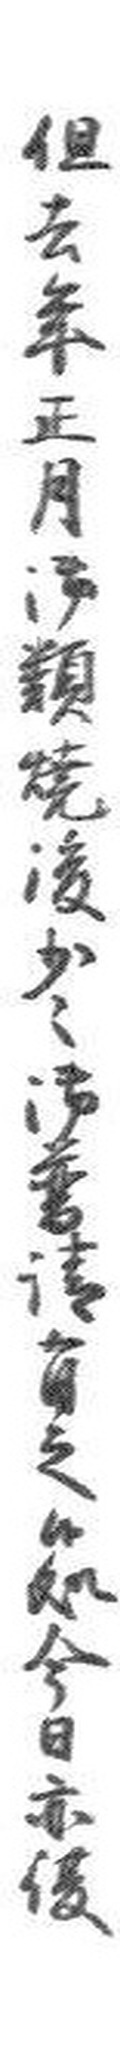但去年正月御類焼後少々御普請有之候処今日亦復
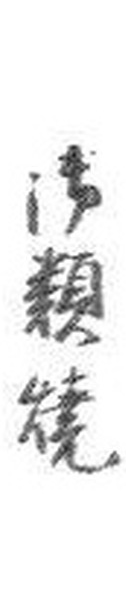御類焼
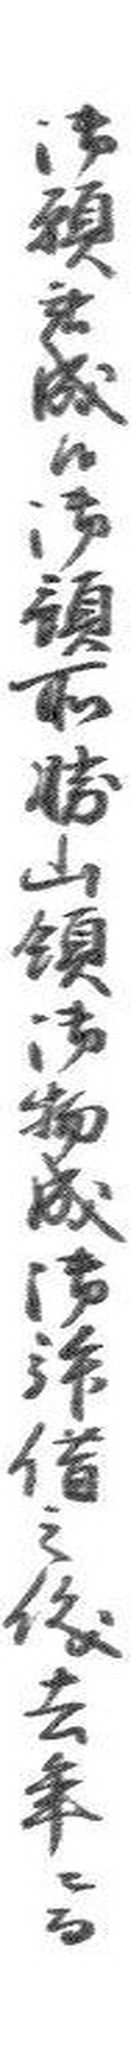御願被成候御預所勝山領御物成御拝借之儀去年ニ而
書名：家譜 五 光通公 従寛永十三年到万治二年
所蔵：福井県文書館 Fukui Prefectural Archives
